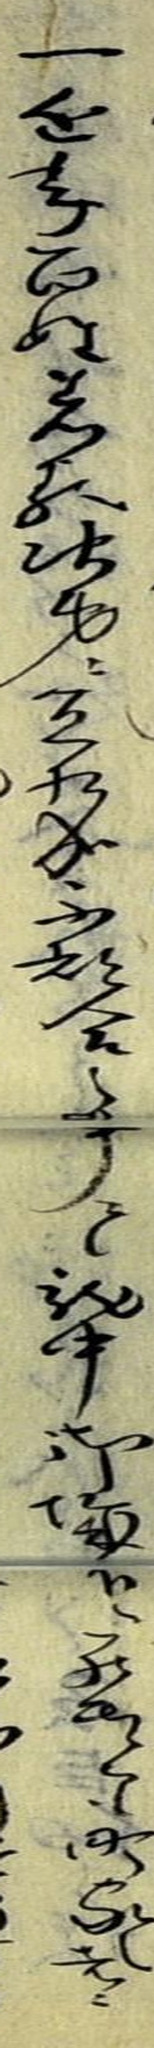一近年百姓着類次第に宜相成不都合之事に候就中御城下へ罷出候而も町家之者に
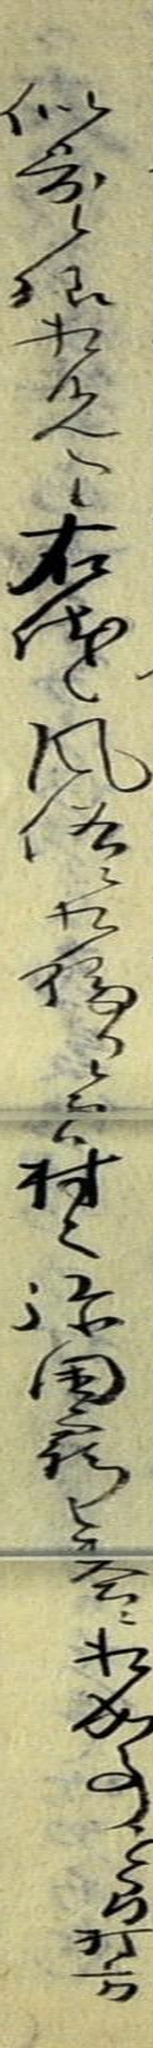似寄候様相見へ候右体之風俗に相移り候而は村々弥困窮之基に相成事に候間村方
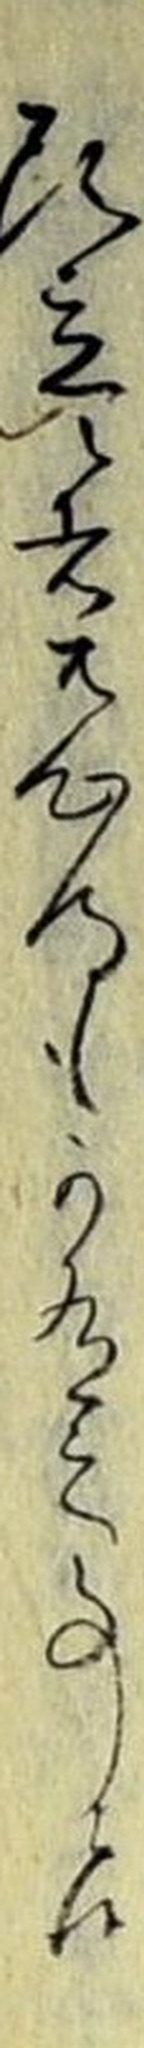頭立之者共心得も可有之事に候
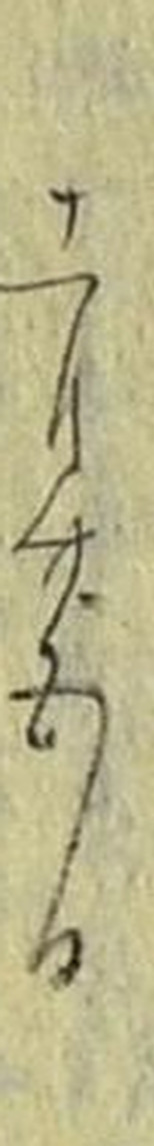十一月廿五日

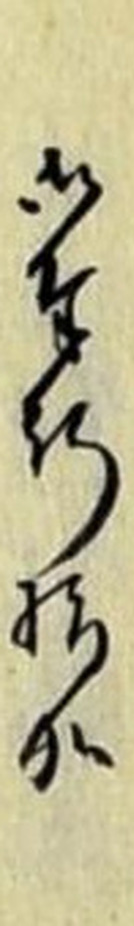御奉行指加
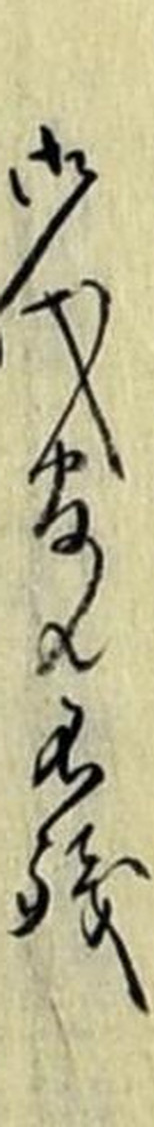御代官共不残
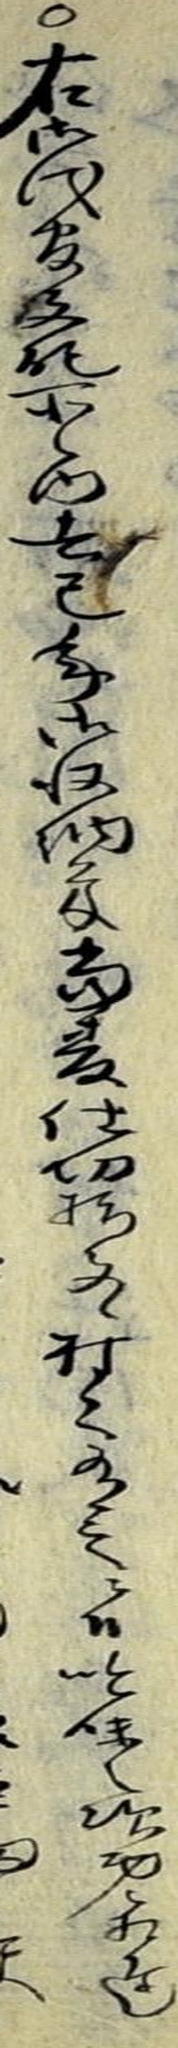〇右御代官支配所之内去巳年御収納米当夏仕切指支候村々有之に付吟味次第に相達
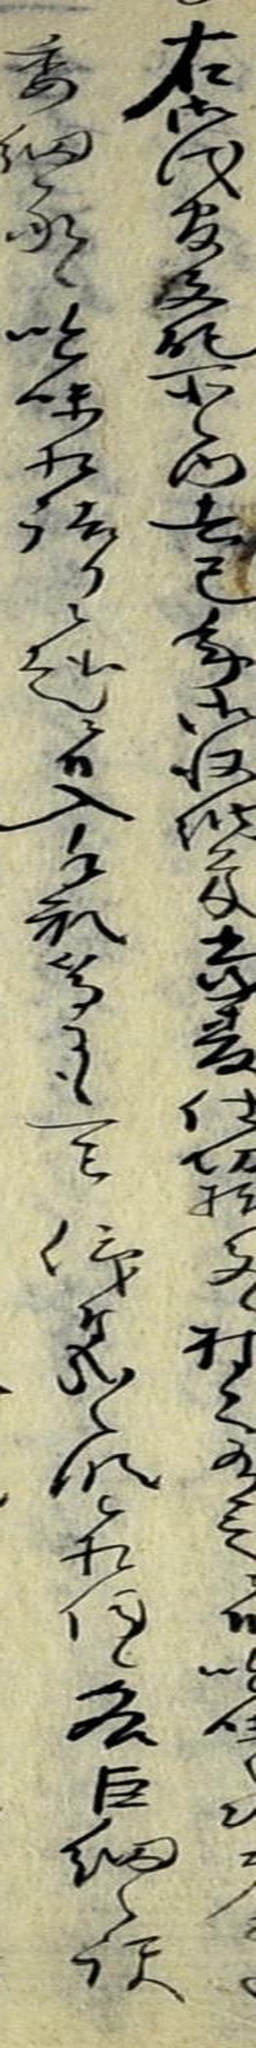委細承候吟味相詰り候趣に付入手形等にも可被仰付哉之段被相伺候各巨細之訳
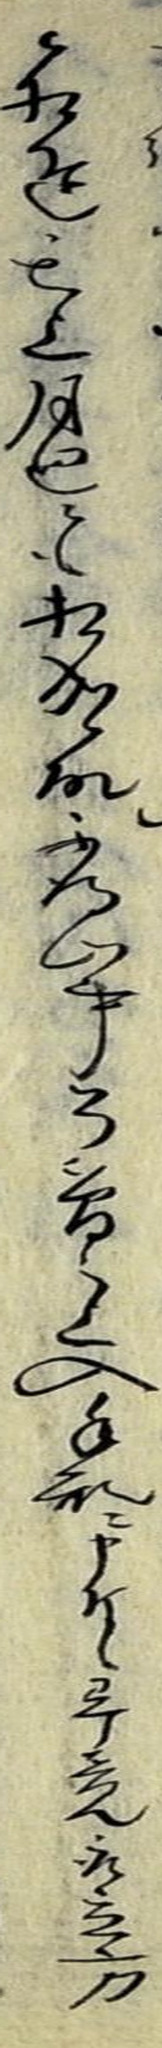被相達其上月廻にも相加候故不得止事了簡之上入手形に申付候畢竟取立方
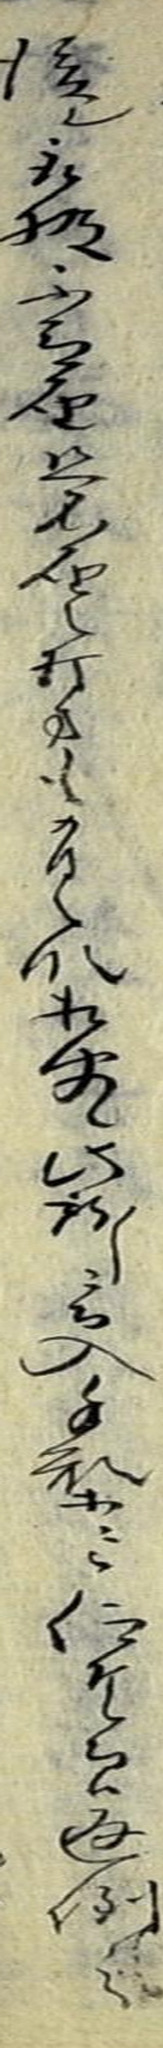後れ取扱不参届且不届之村方も有之段相聞候此度ゝ？に而入手形等に被仰付候而は通例之
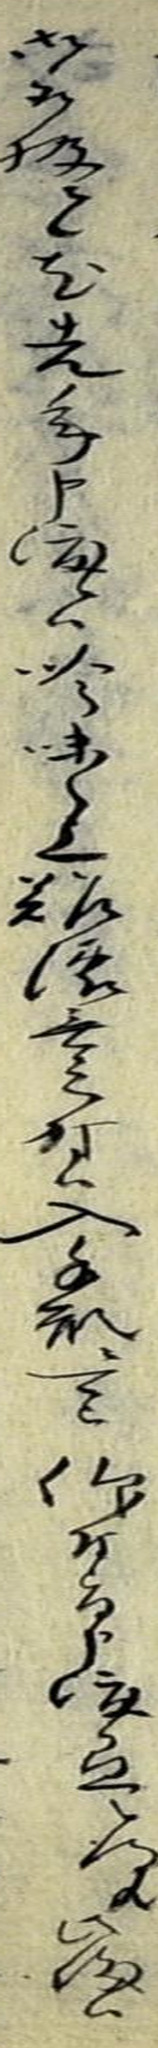御取扱に候尤先年申渡候は吟味之上難渋無之村は入手形に可被仰付旨申渡置候得共此儀は
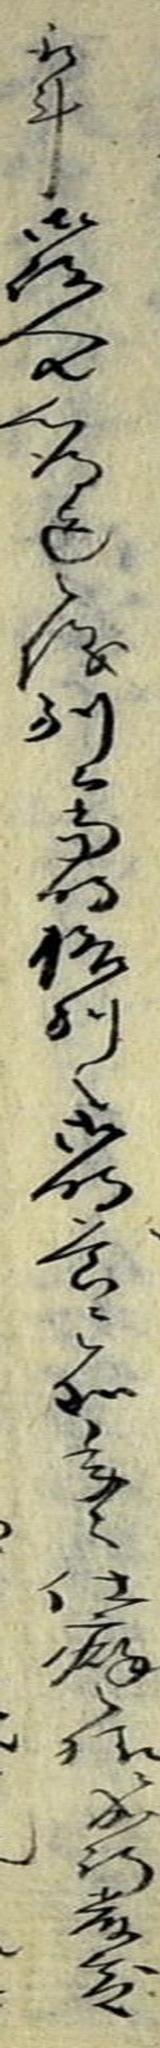取斗候御役人共心得迄之儀別而当時格別之御時節に候処年々仕癖之様に成行厳敷
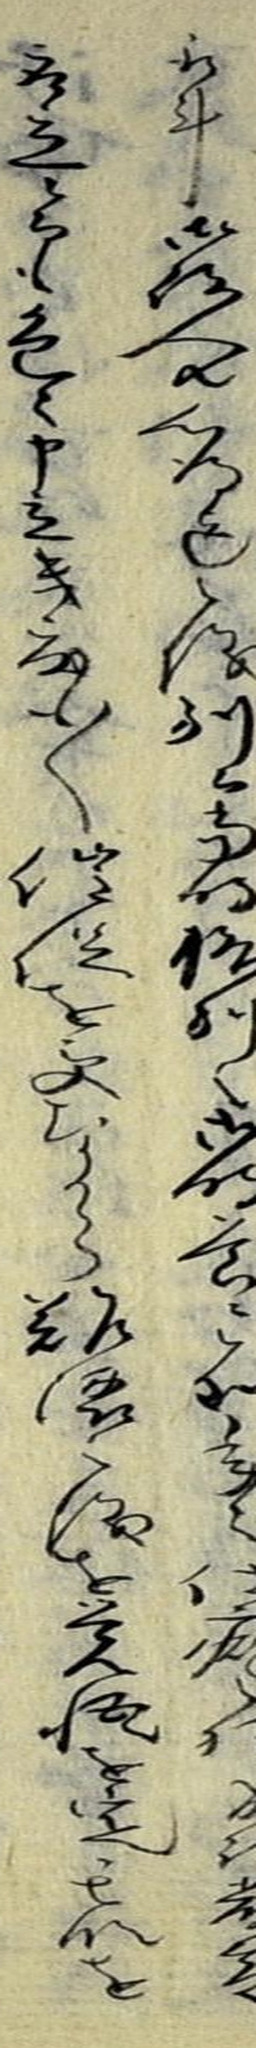取立に而も色々申立幾度も〳〵催促を受なから難渋を覚悟を定其段を
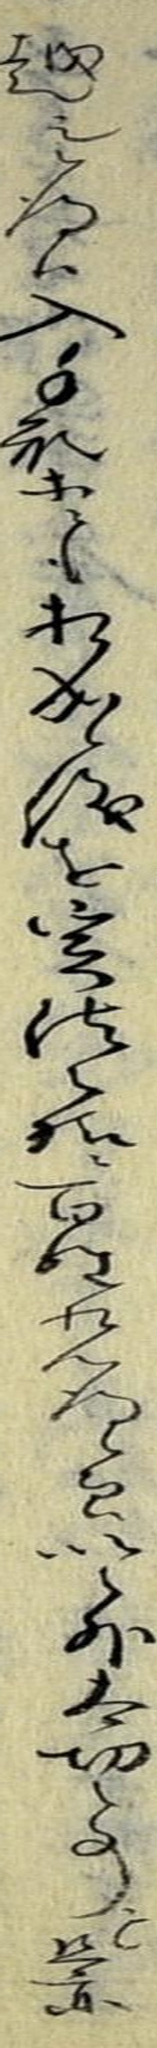越し候得は入手形等にも相成候儀を定法之様に百姓相心得候而は以之外太切之事に候且亦
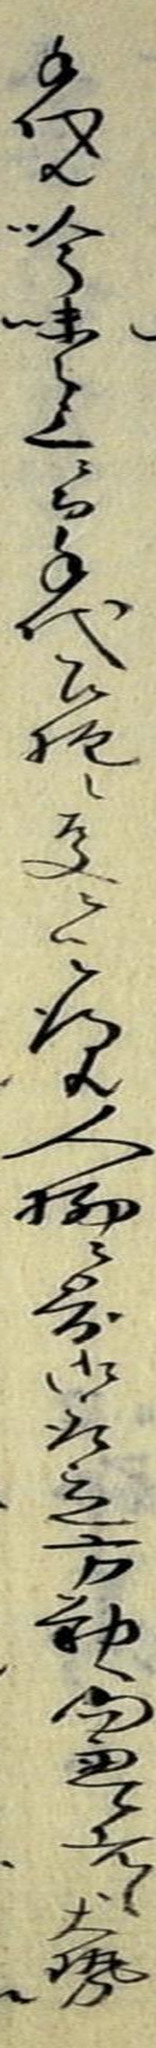手代共吟味之上に而手代召抱之事には候得共人柄に寄御取立方勤へ向兼候者も大勢
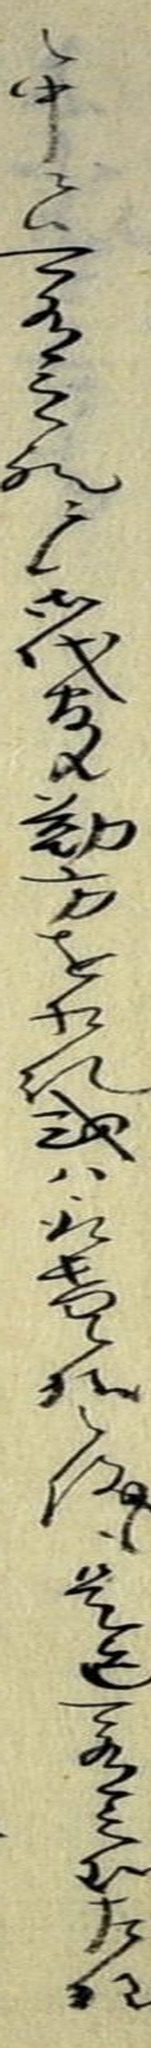之中には可有之歟に候御代官共勤方を相糺或は取替候様之儀も是迄可有之処左様
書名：命令之部 二
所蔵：福井県文書館 Fukui Prefectural Archives
